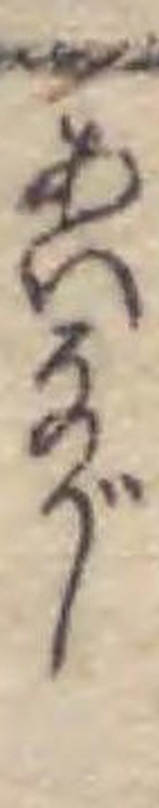あいながし
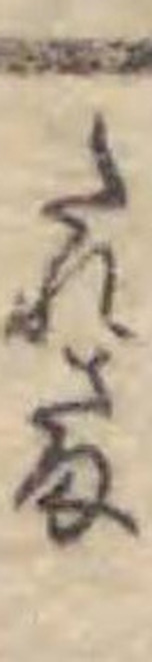たれさま
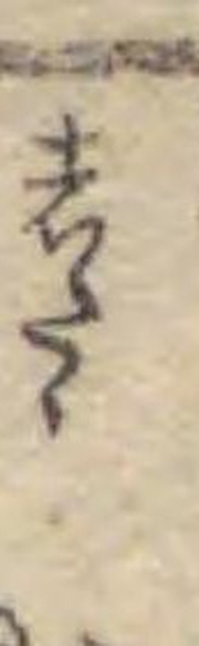したゝ
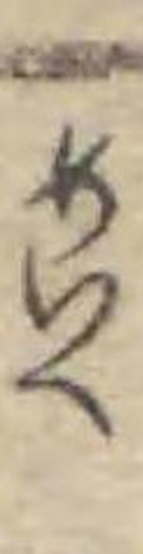めいへ
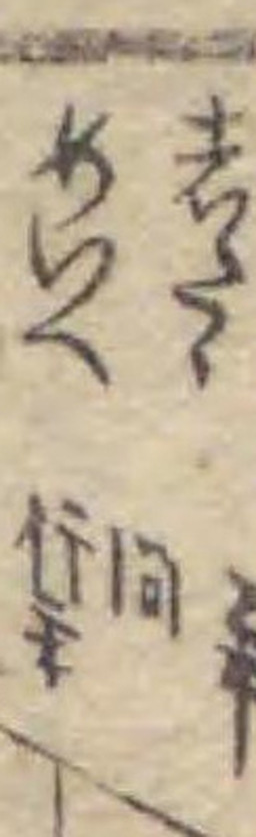めいへ
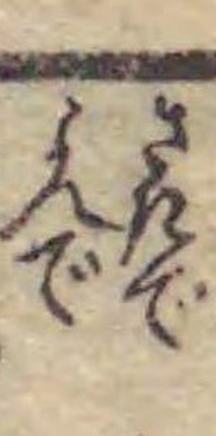よんで
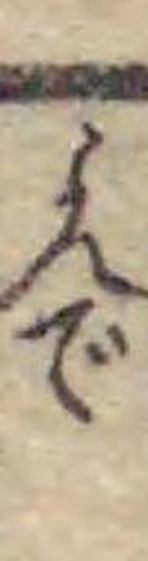よんで
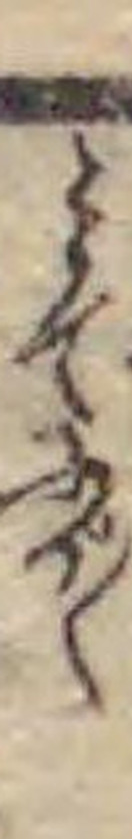みてにが〳〵
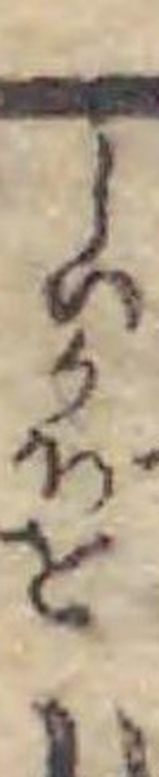しいかほを
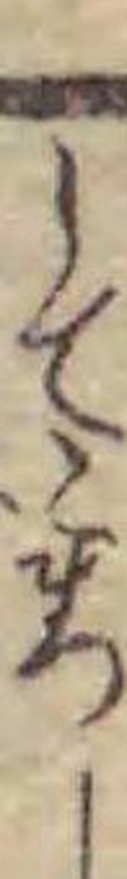してこまつ
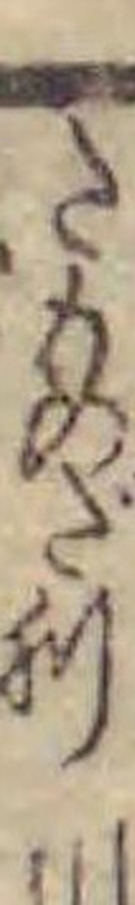たものだ利
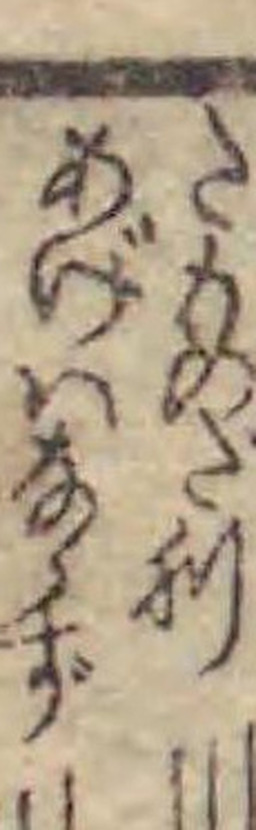あげはならず
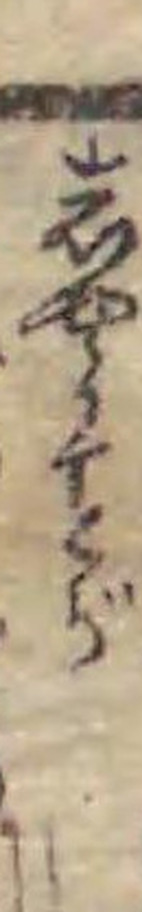しやうことが
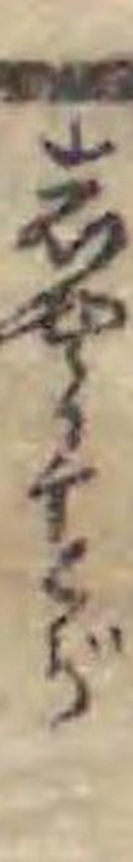しやうことが
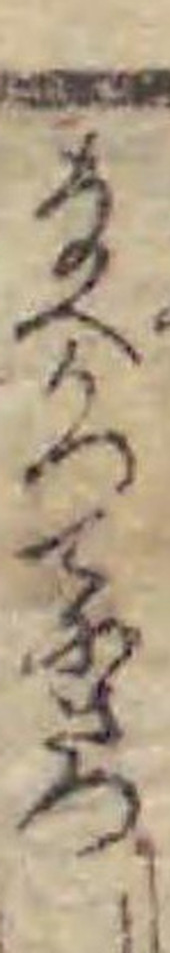なへかつてにさつ
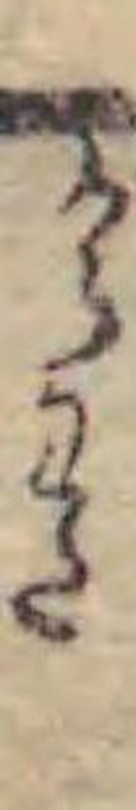がらわた
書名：紙屑身上噺 : 3巻
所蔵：国立国会図書館 National Diet Library, JAPAN
